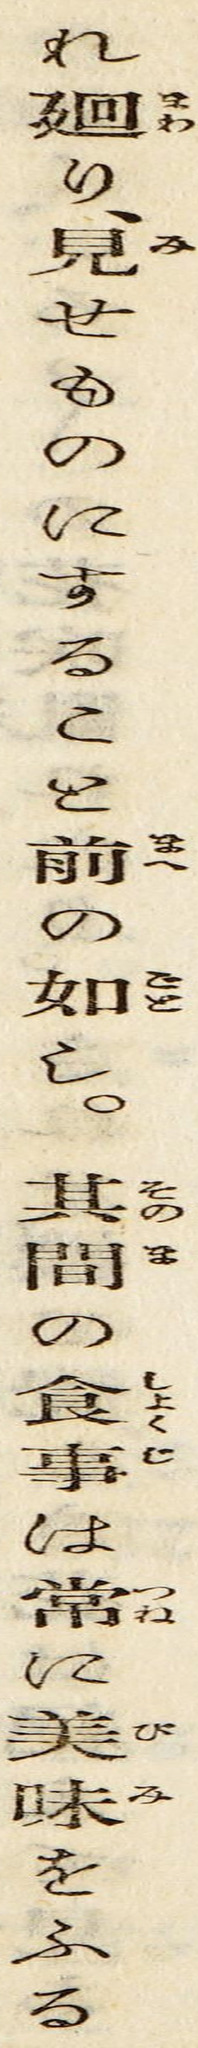れ廻り、見せものにすること前の如し。其間の食事は常に美味をふる
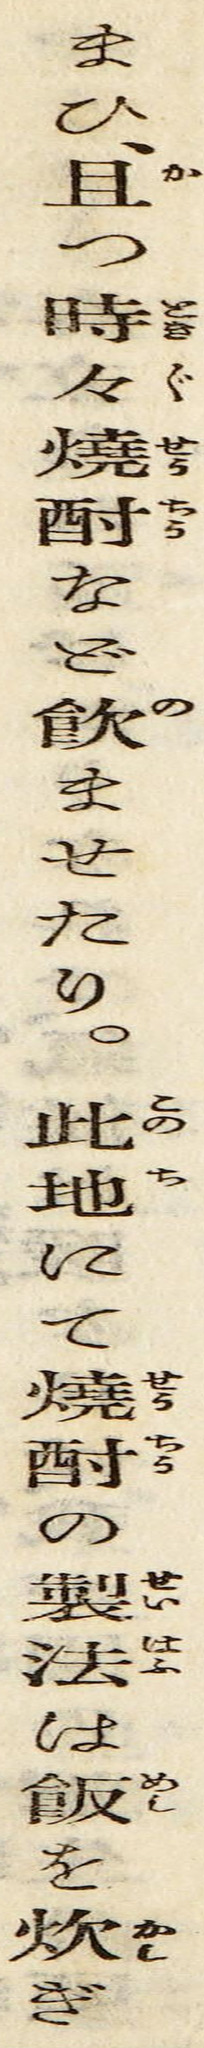まひ、且つ時々焼酎など飲ませたり。此地にて焼酎の製法は飯を炊ぎ
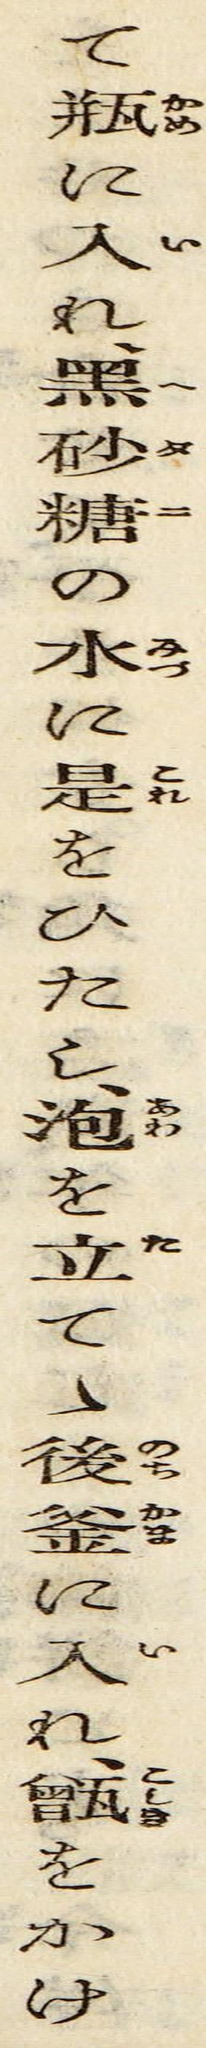て瓶に入れ、黒砂糖の水に是をひたし、泡を立てゝ後釜に入れ、甑をかけ

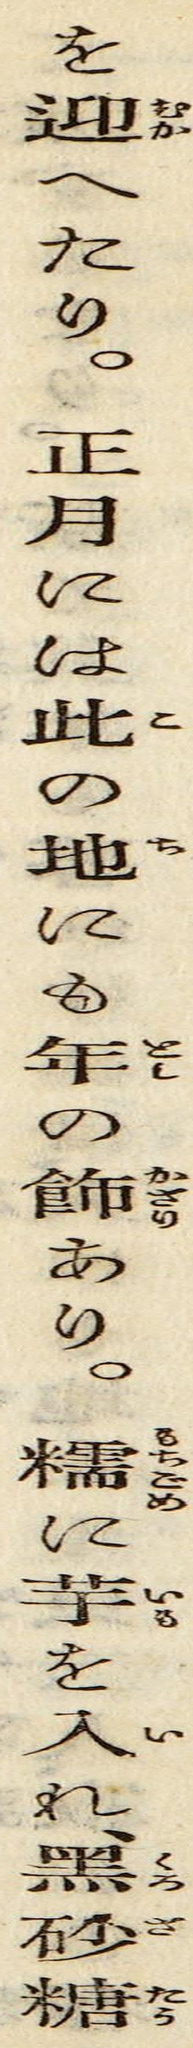を迎へたり。正月には此の地にも年の飾あり。糯に芋を入れ、黒砂糖
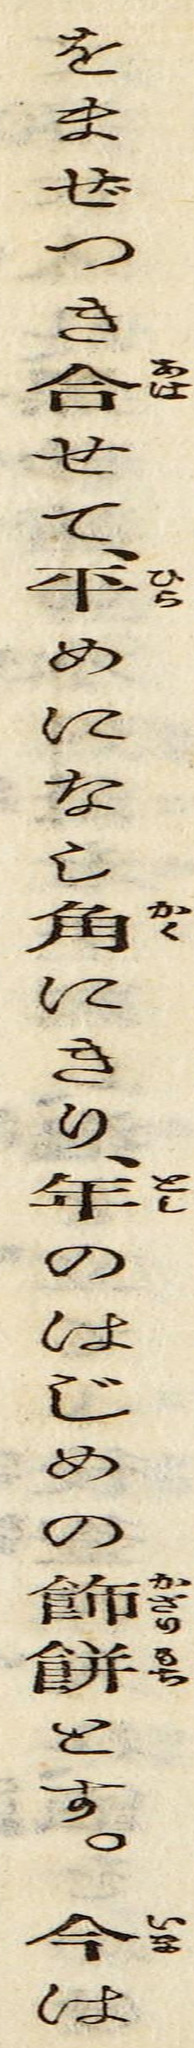をまぜつき合せて、平めになし角にきり、年のはじめの飾餅とす。今は
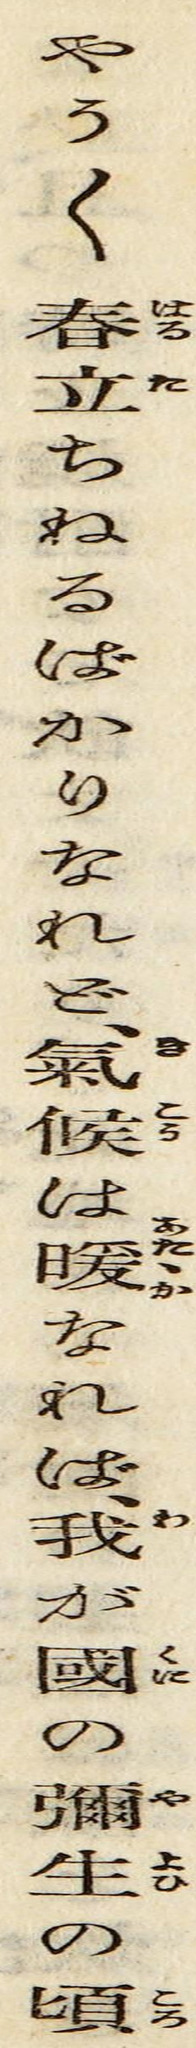やう〳〵春立ちねるばかりなれど、気候は暖なれば、我が国の弥生の頃
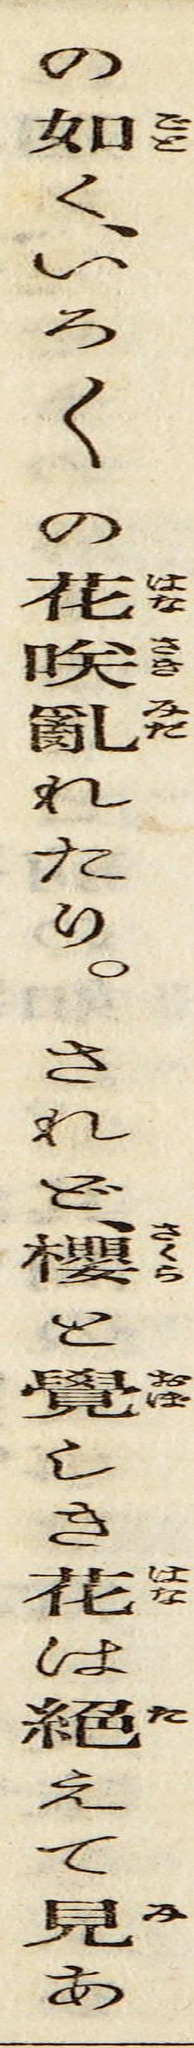の如く、いろ〳〵の花咲乱れたり。されど、桜と覚しき花は絶えて見あ
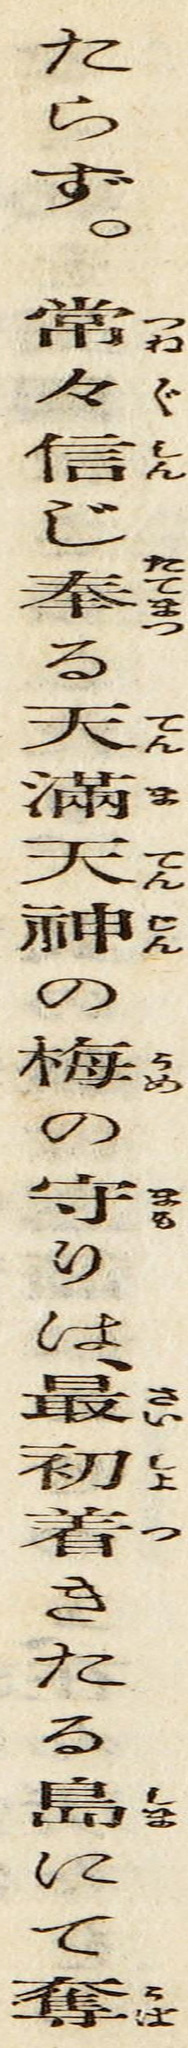たらず。常々信じ奉る天満天神の梅の守りは、最初着きたる島にて奪
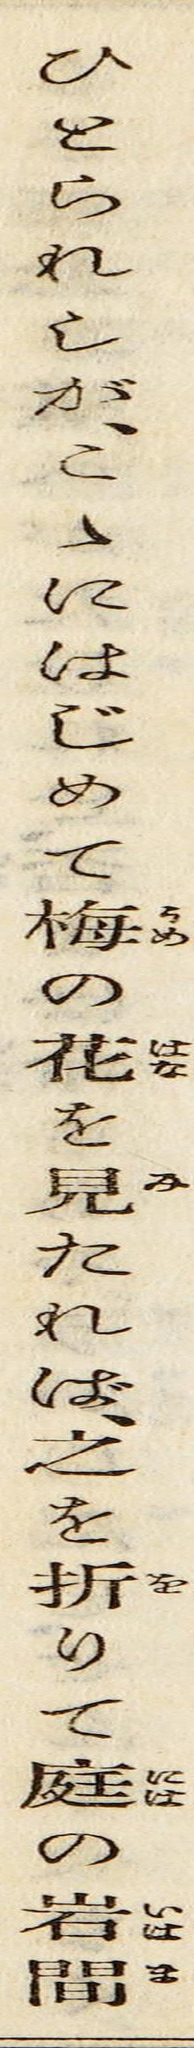ひとられしが、こゝにはじめて梅の花を見たれば、之を折りて庭の岩間
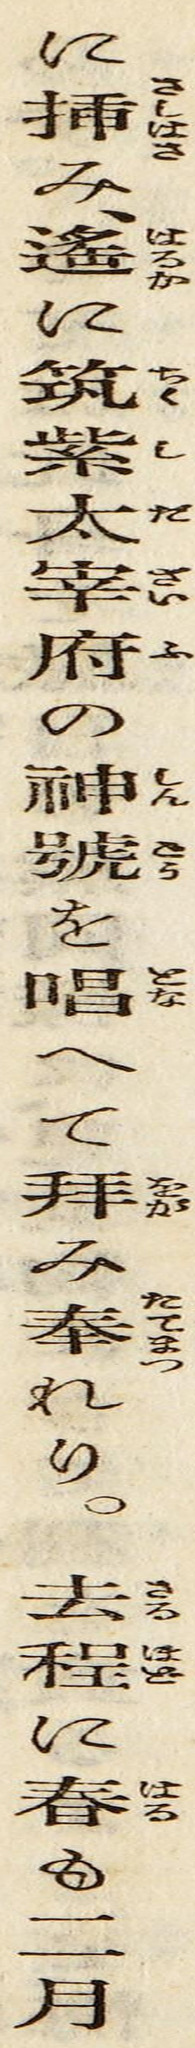に挿み、遥に筑紫太宰府の神号を唱へて拝み奉れり。去程に春も二月
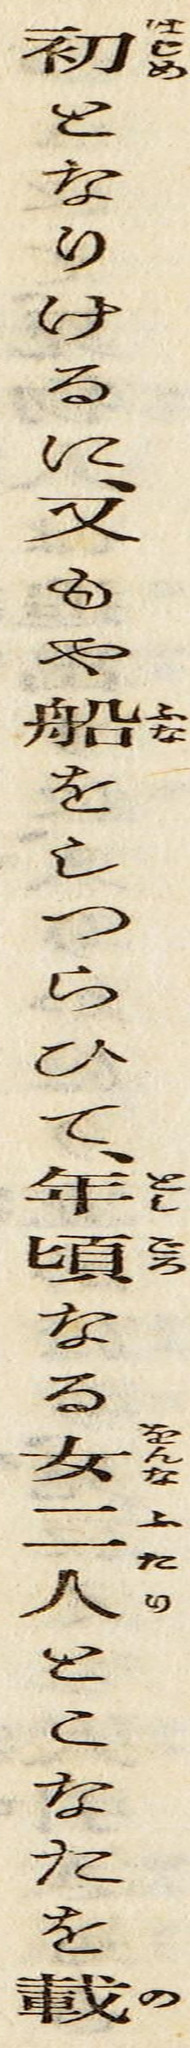初となりけるに、又もや船をしつらひて、年頃なる女二人とこなたを載
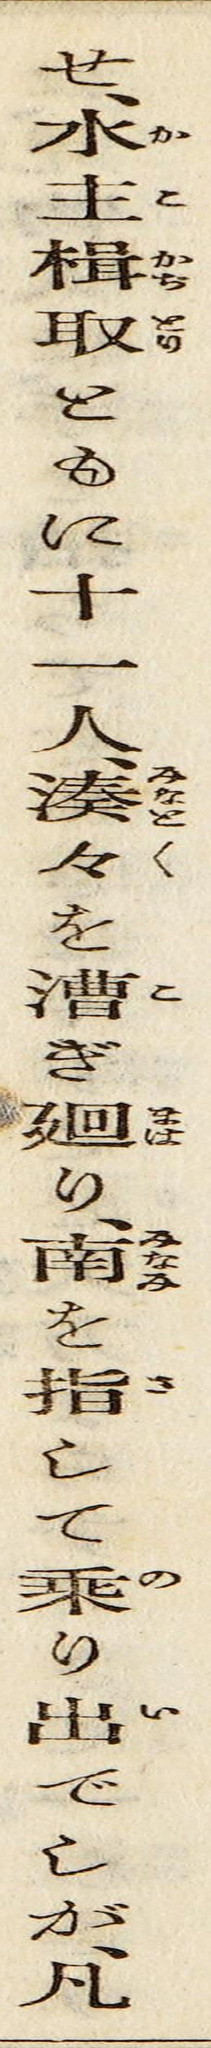せ、水主楫取ともに十一人、湊々を漕ぎ廻り、南を指して乗り出でしが、凡
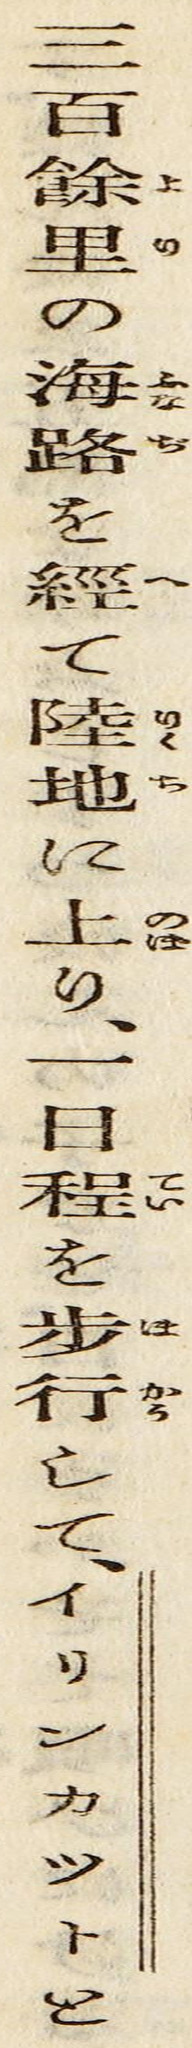三百余里の海路を経て陸地に上り、一日程を歩行して、イリンカツトと
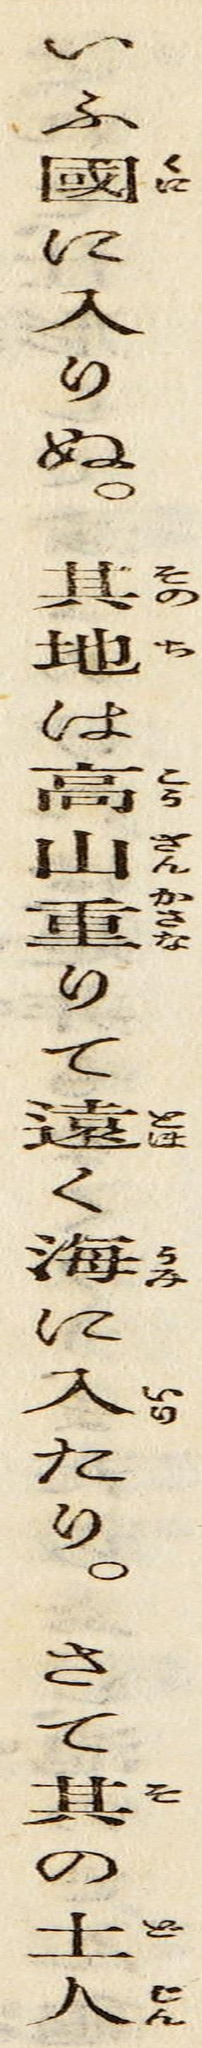いふ国に入りぬ。其地は高山重りて遠く海に入たり。さて其の土人
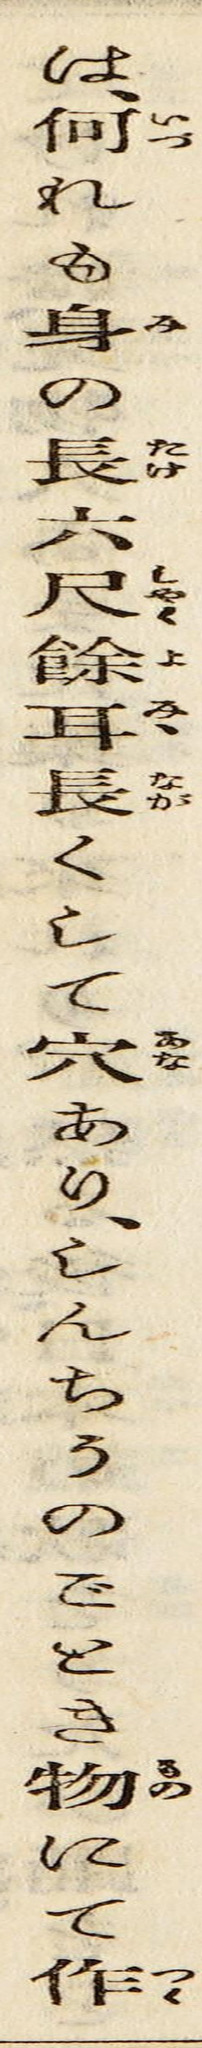は、何れも身の長六尺余耳長くして穴あり、しんちうのごとき物にて作
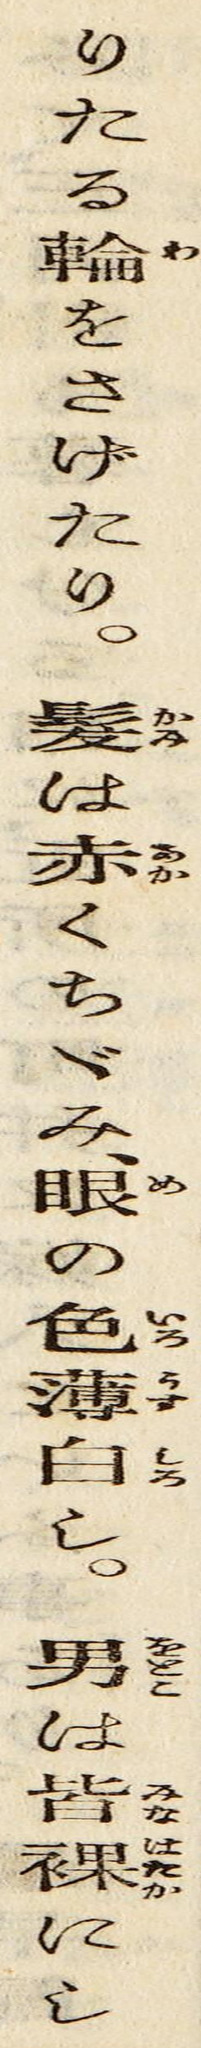りたる輪をさげたり。髪は赤くちヾみ、眼の色薄白し。男は皆裸にし
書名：日本漂流譚
